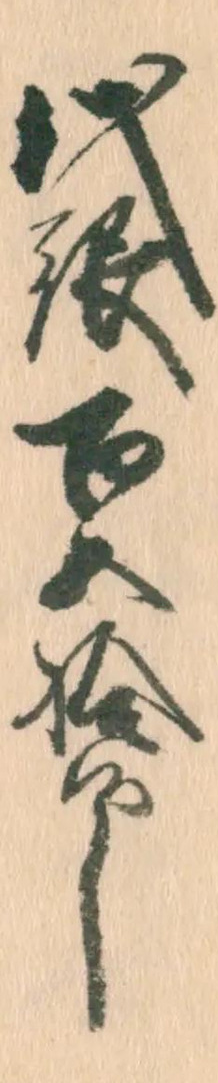代銀六拾匁
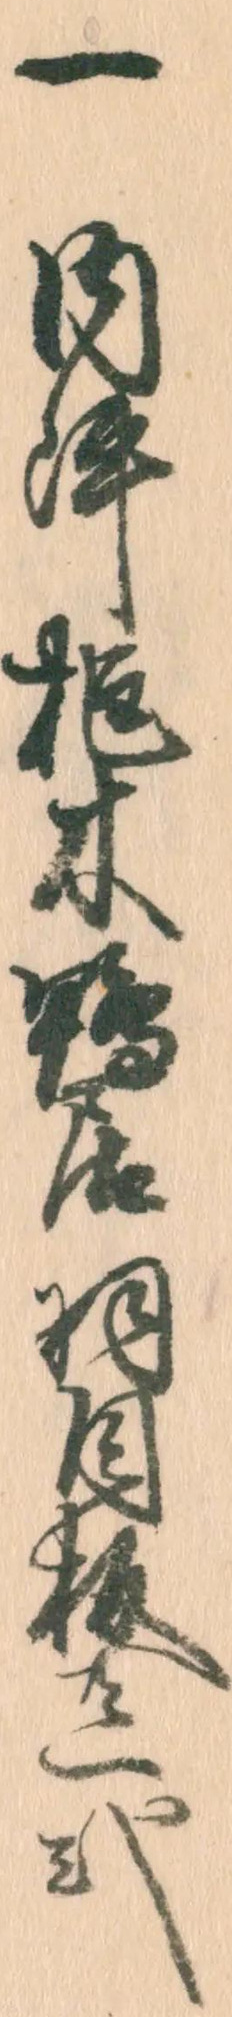一内陣框木鴨居羽目板共一式
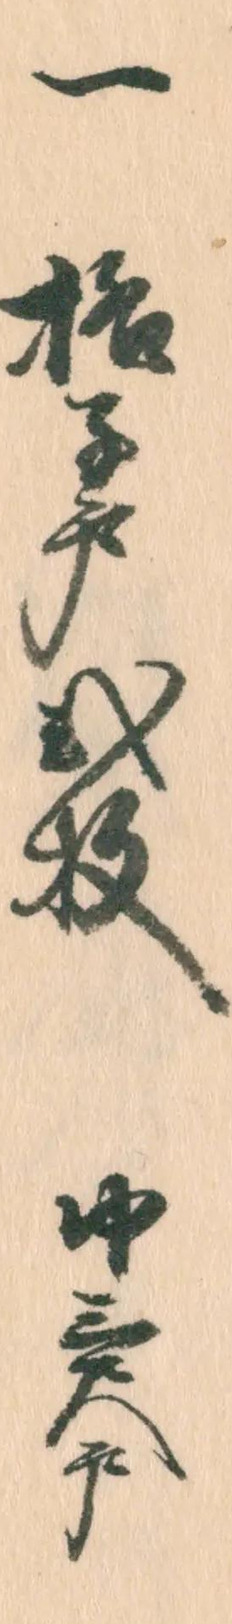一格子戸弐枚巾三尺戸
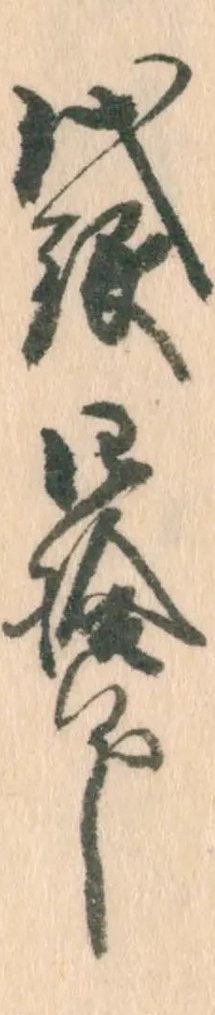代銀六拾匁

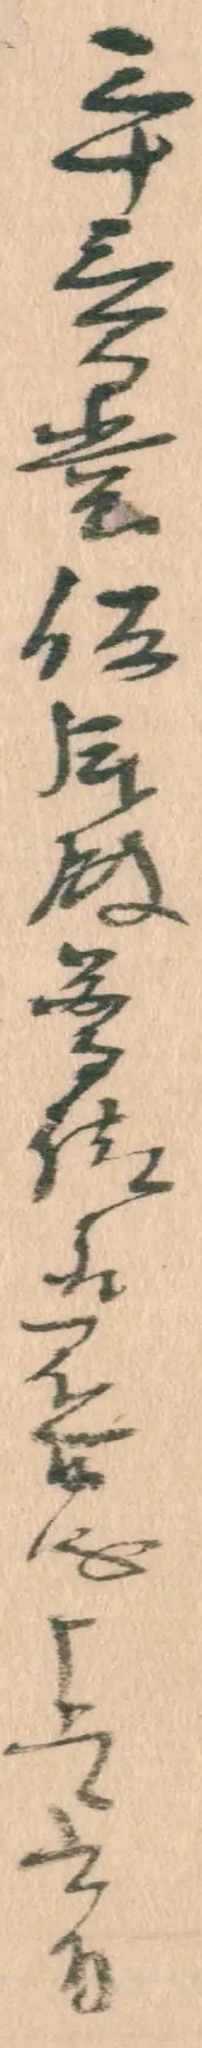│三十三間堂仮拝殿御普請取懸候儀申上候書付
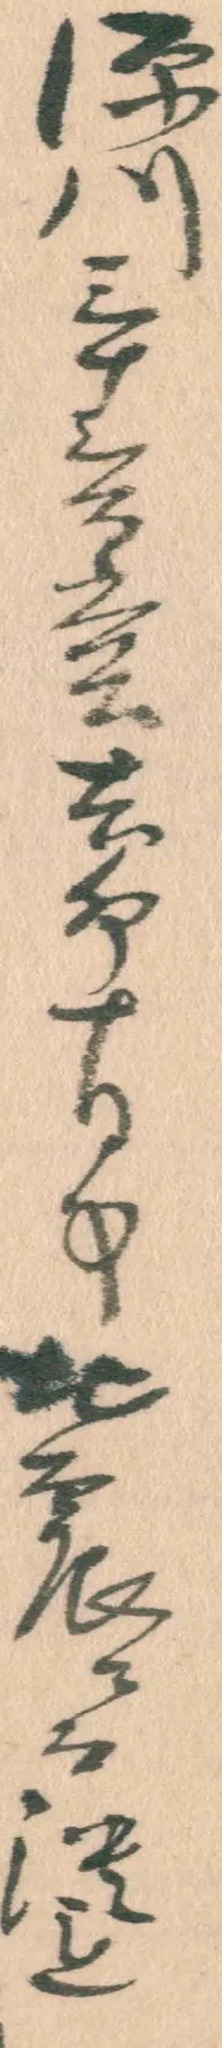深川三十三間堂去卯十月中地震ニて潰れ候ニ付
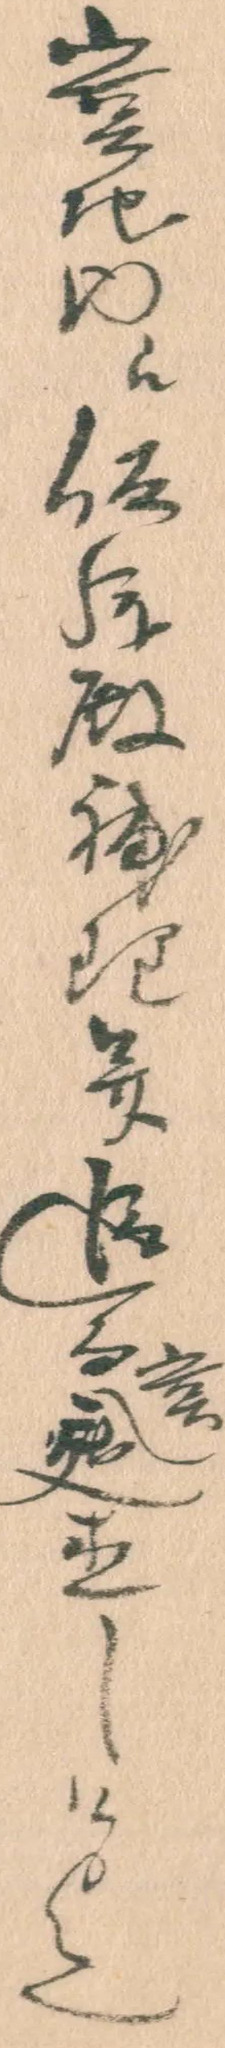堂地内え仮拝殿補理幷追而堂建直し候迄
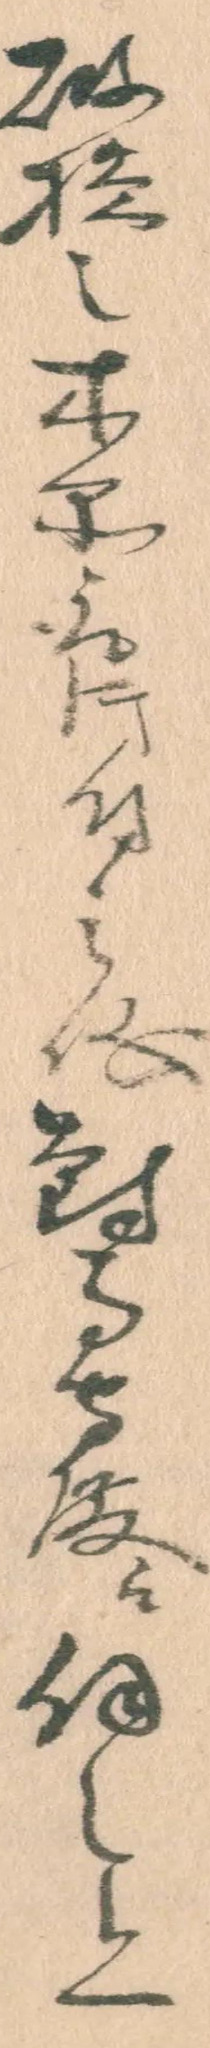破損之木品取片付之義対馬守殿え伺之上
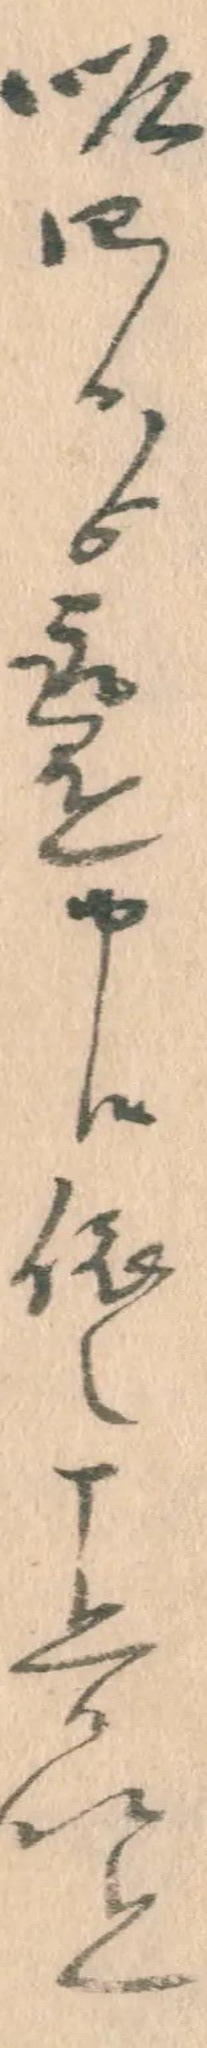昨四日ゟ取懸申候依之申上候以上

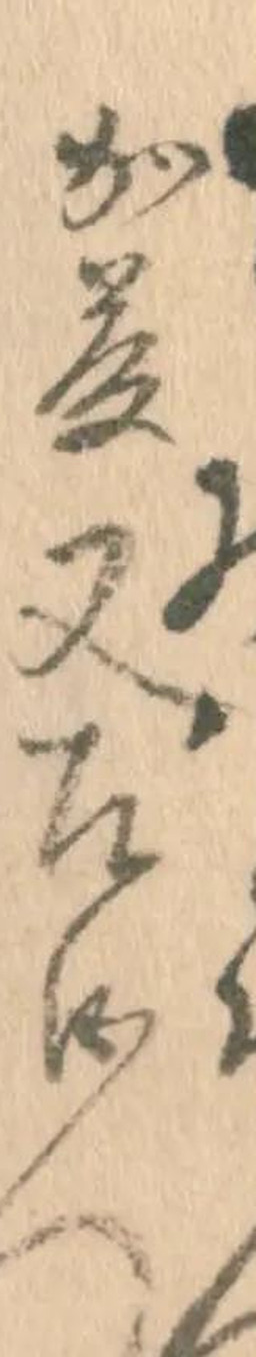加藤又左衛門
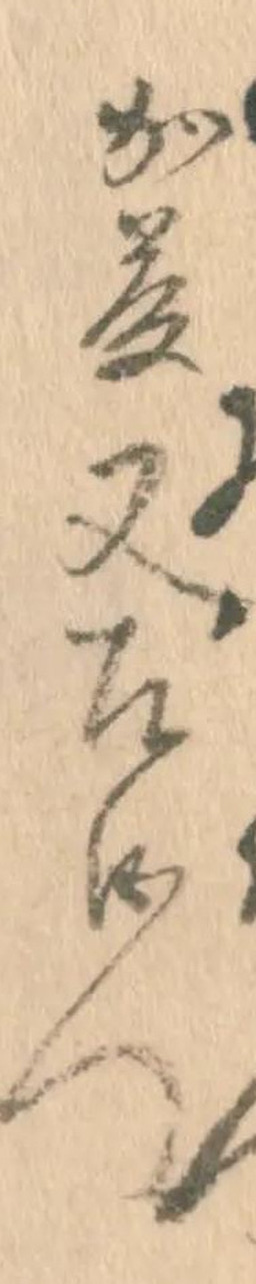加藤又左衛門

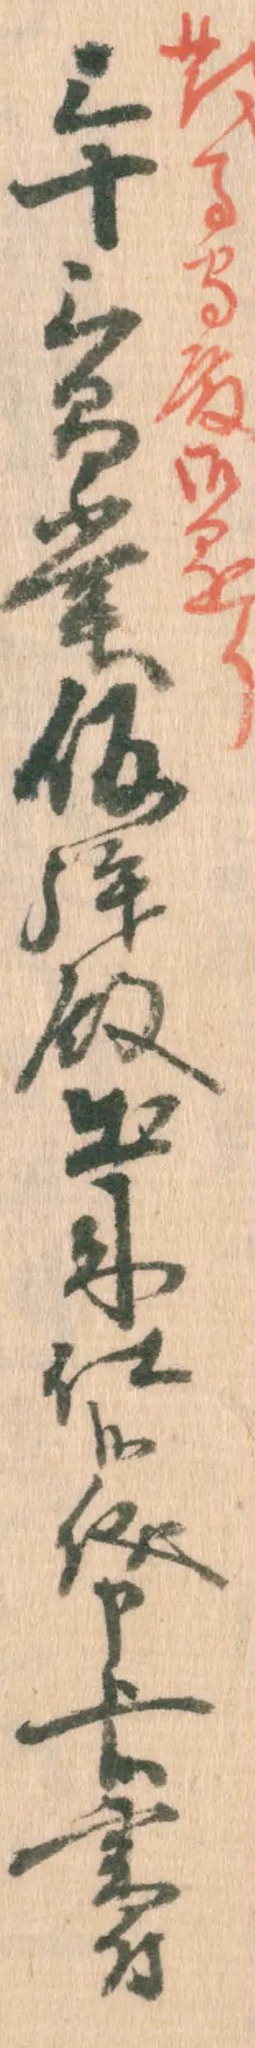│三十三間堂仮拝殿出来仕候儀申上候書付
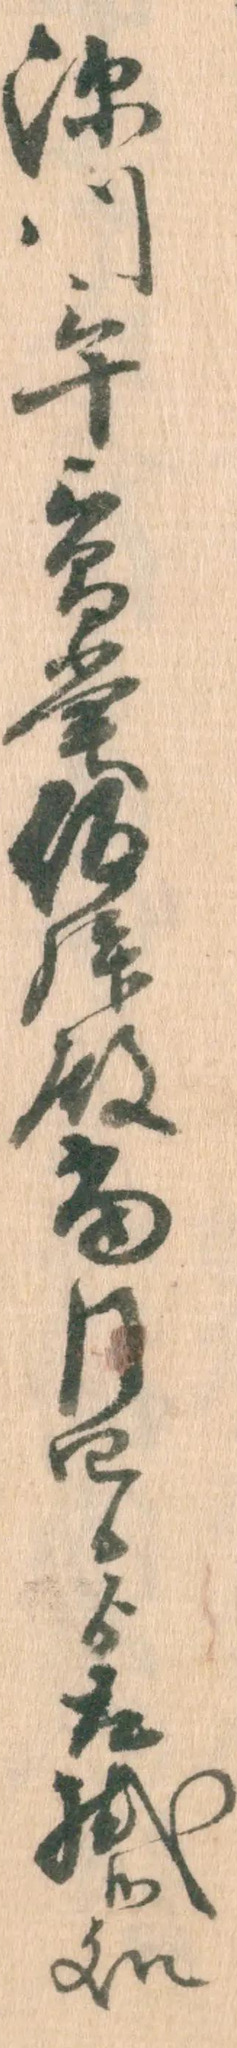深川三十三間堂仮拝殿当月四日ゟ取掛候処
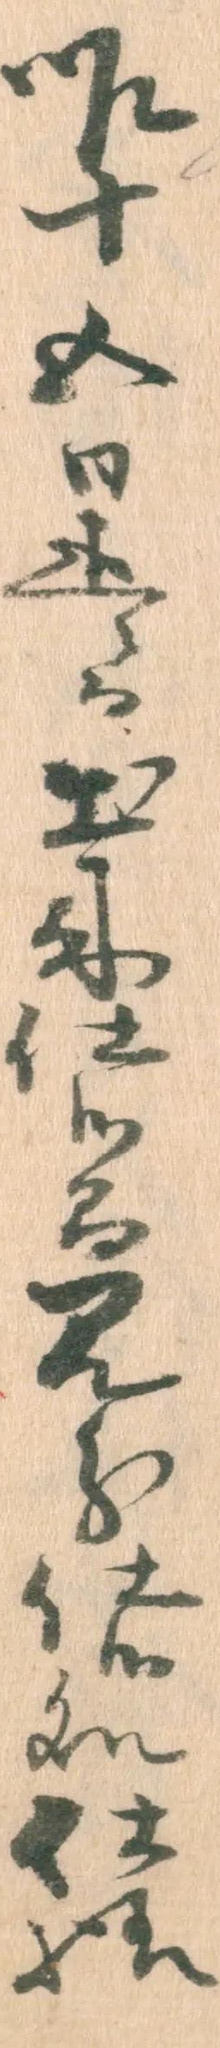昨十五日迄ニて出来仕候間見分仕候処仕様
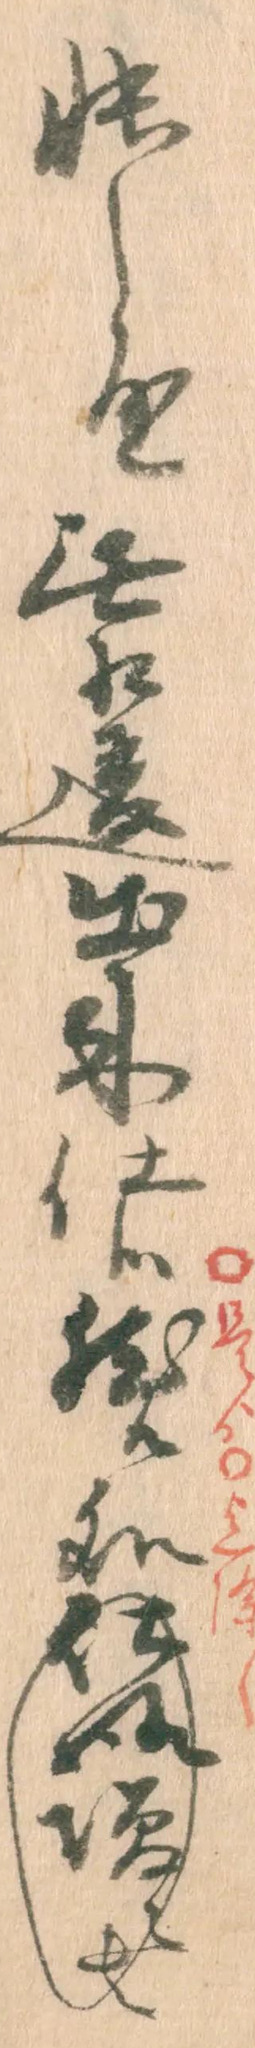帳之通無相違出来仕候然ル処仕様増ニは

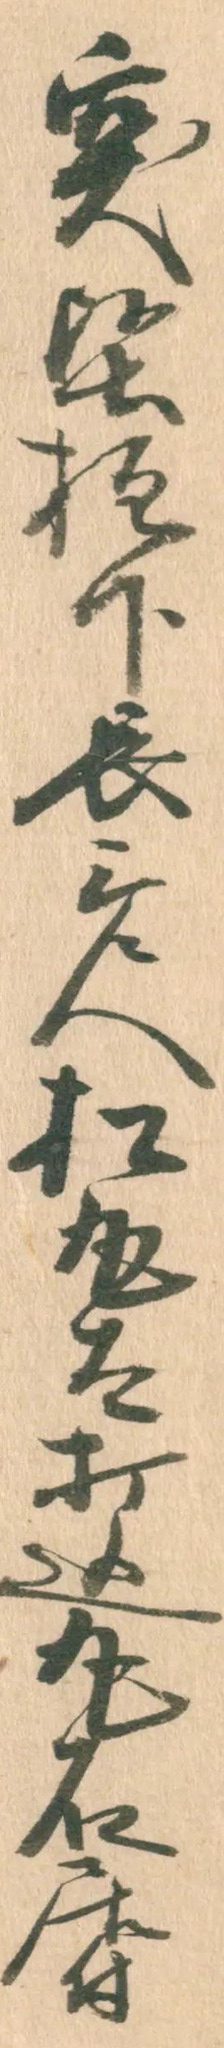突堅柱下長三尺松丸太打込丸石居付
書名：三十三間堂. [2]
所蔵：国立国会図書館 National Diet Library, JAPAN
